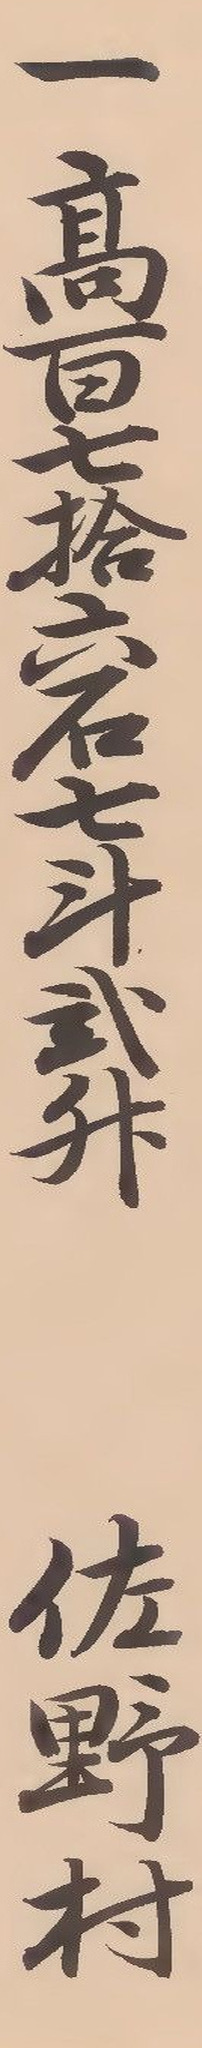一高百七拾六石七斗弐升佐野村
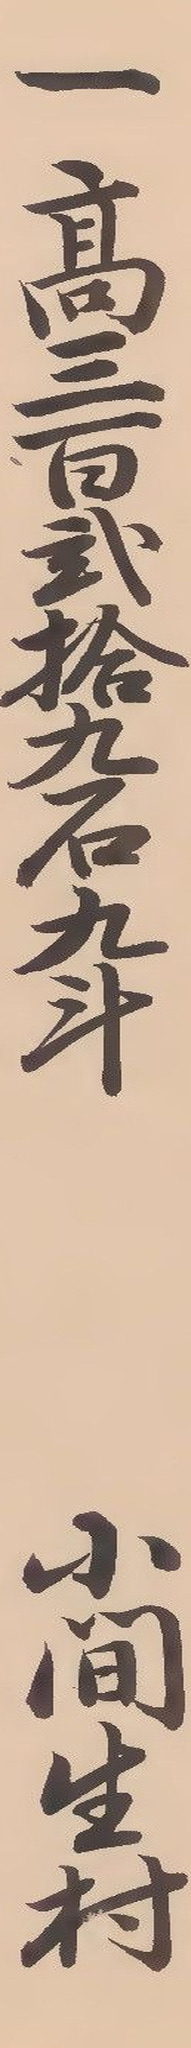一高三百弐拾九石九斗小間生村
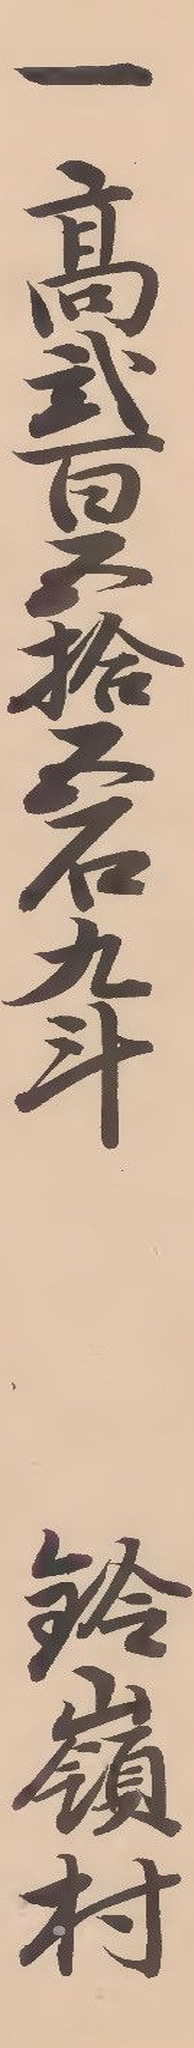一高弐百五拾五石九斗鈴嶺村
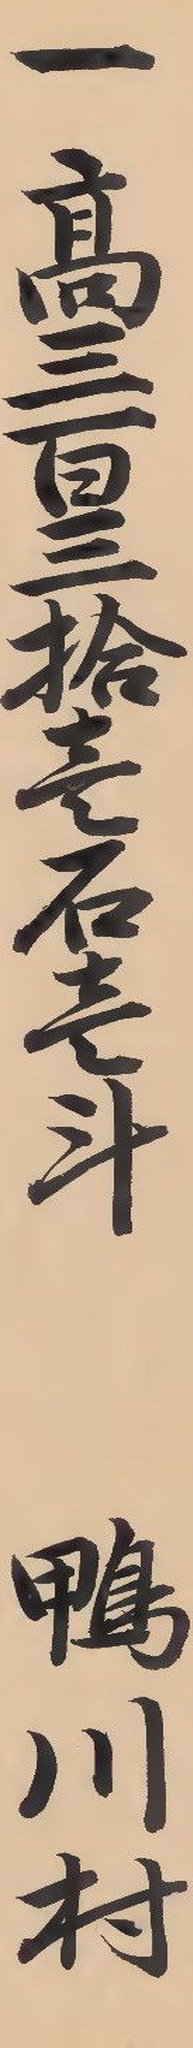一高三百三拾壱石壱斗鴨川村
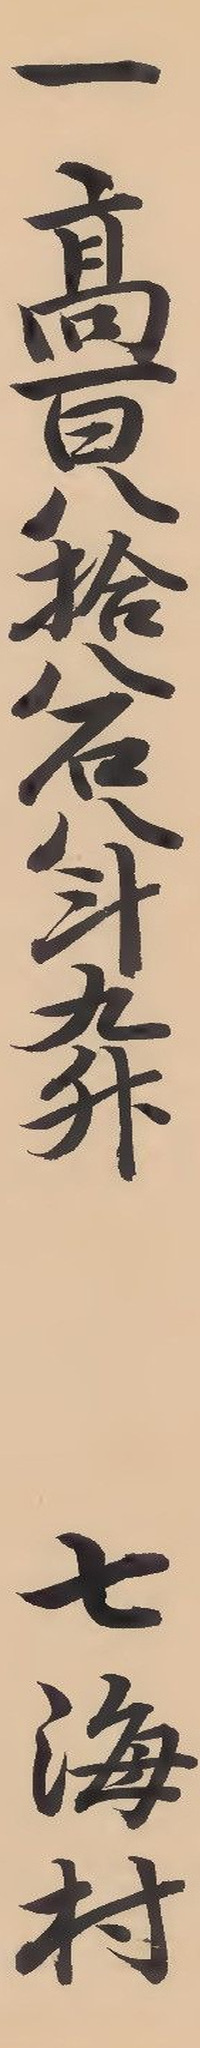一高百八拾八石八斗九升七海村
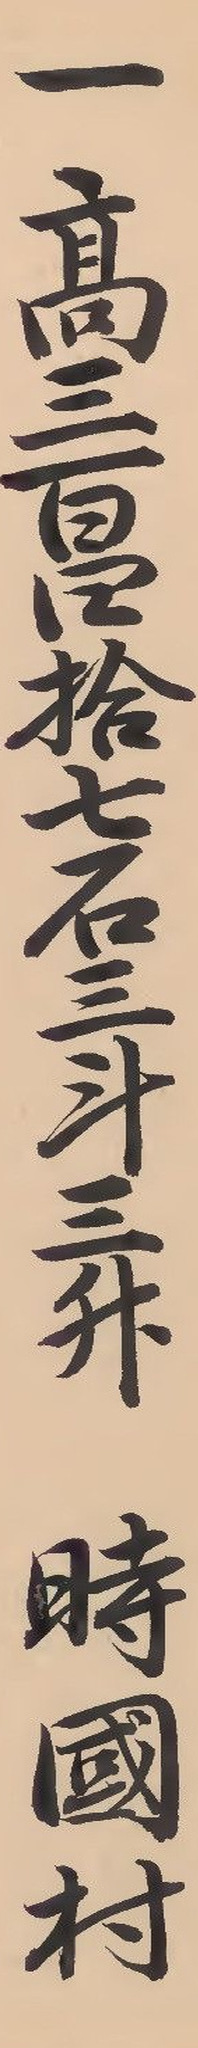一高三百四拾七石三斗三升時国村

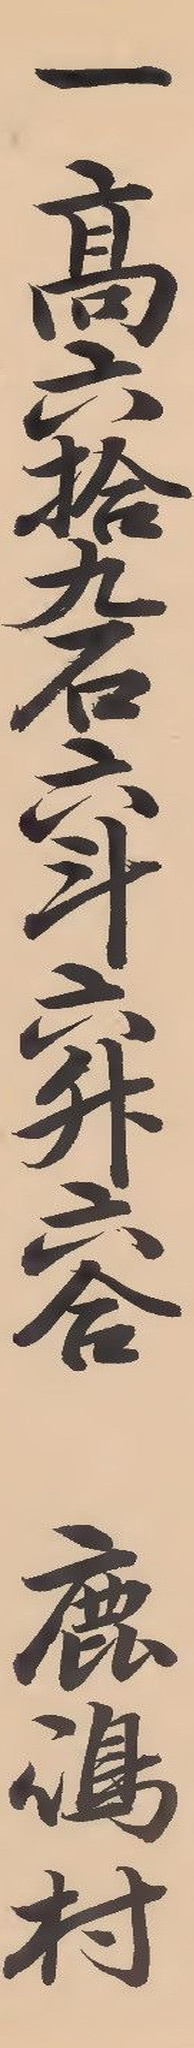一高六拾九石六斗六升六合鹿島村
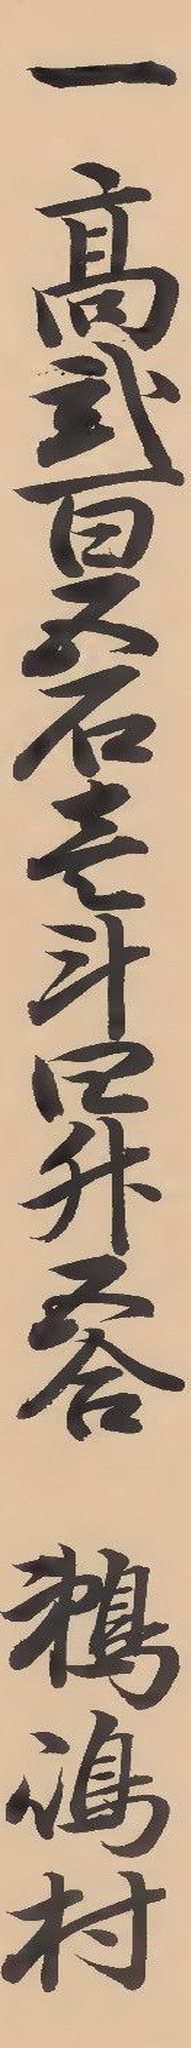一高弐百五石壱斗四升五合鵜島村
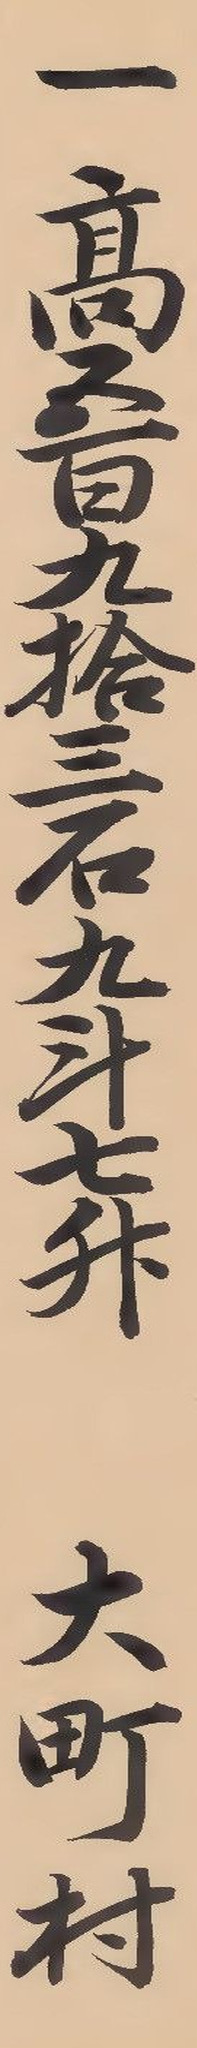一高五百九拾三石九斗七升大町村
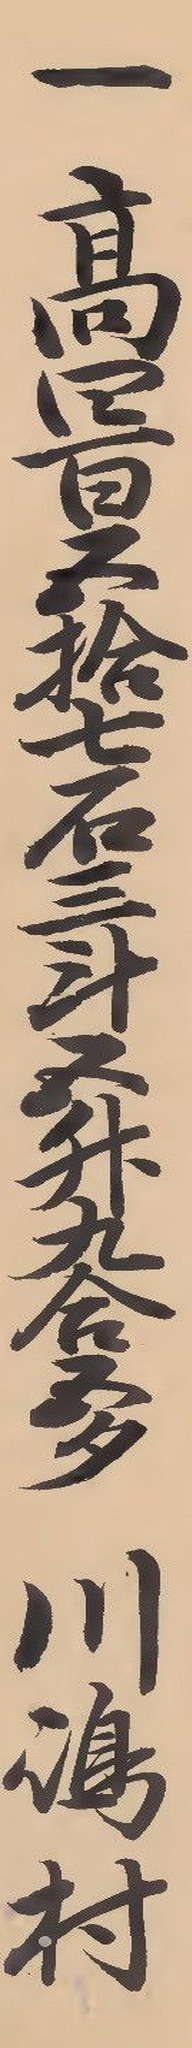一高四百五拾七石三斗五升九合五勺川島村
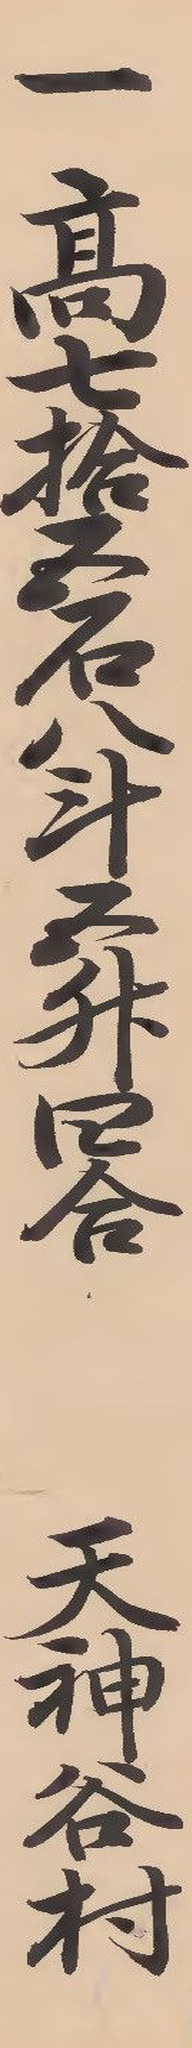一高七拾五石八斗五升四合天神谷村
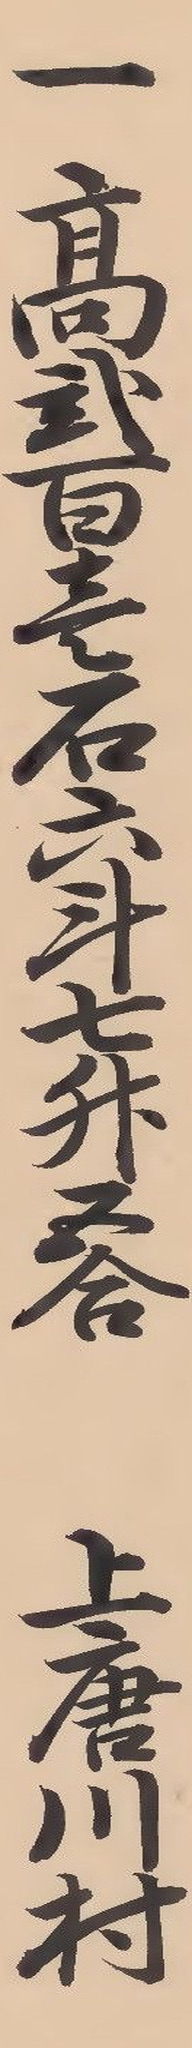一高弐百壱石六斗七升五合上唐川村
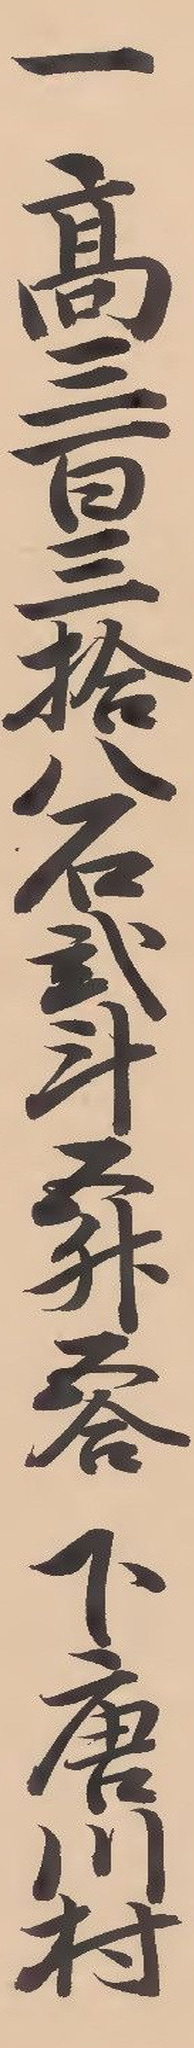一高三百三拾八石弐斗五升五合下唐川村
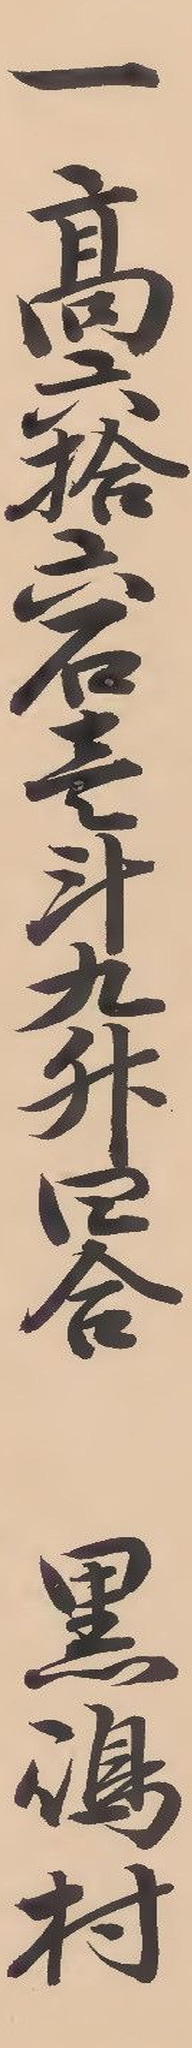一高六拾六石壱斗九升四合黒島村

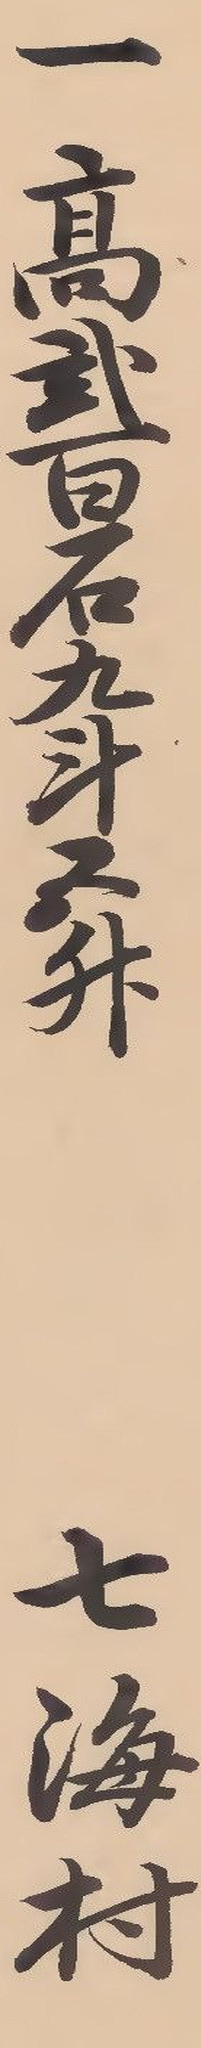一高弐百石九斗五升七海村
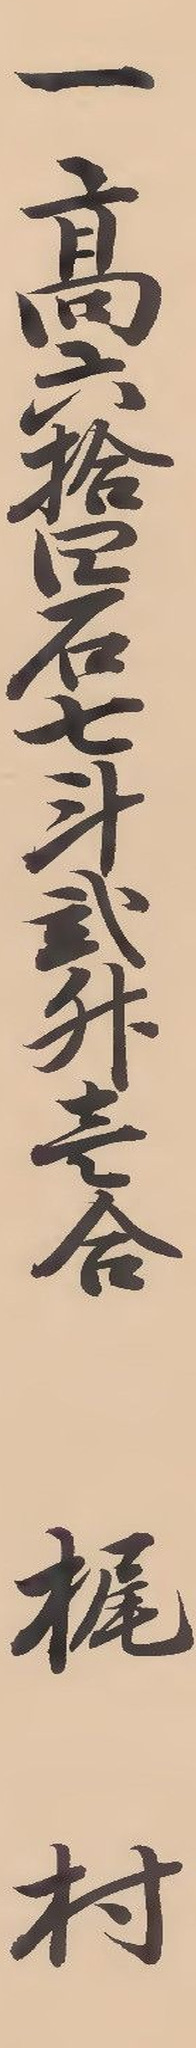一高六拾四石七斗弐升壱合梶村
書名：能登国郷帳
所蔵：国立公文書館 National Archives of Japan
